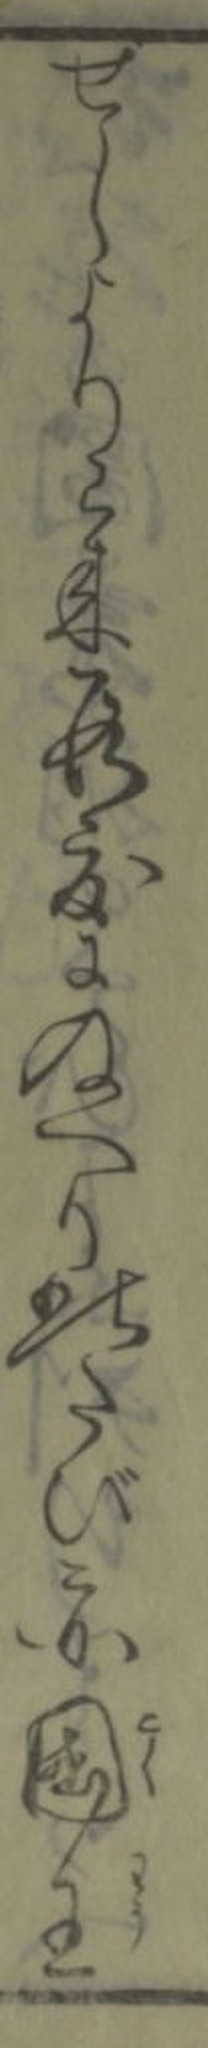せしより已来毎度に及へり此たび亦国王
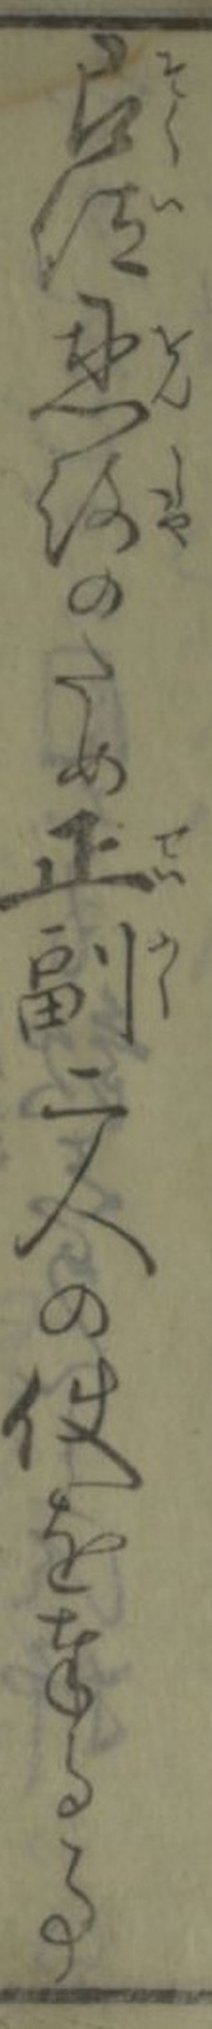即位恩謝のため正副二人の仗を奉る事
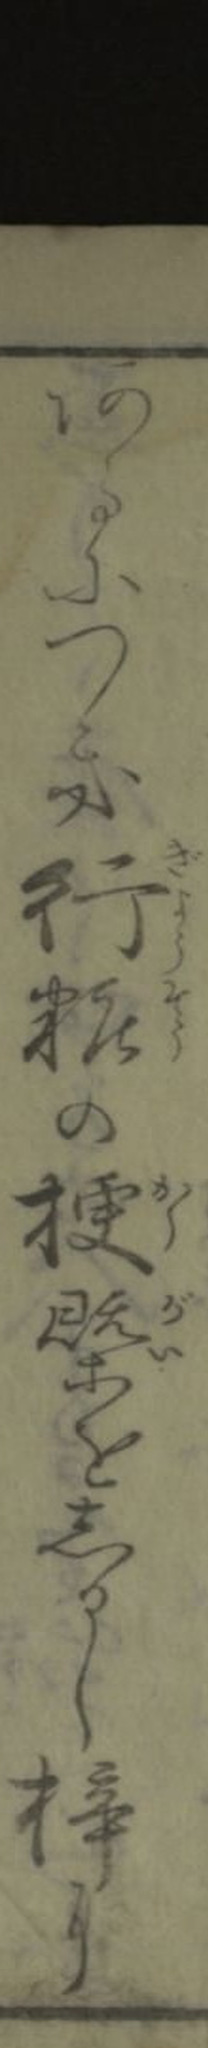あるにつき行粧の梗概をしるし梓に

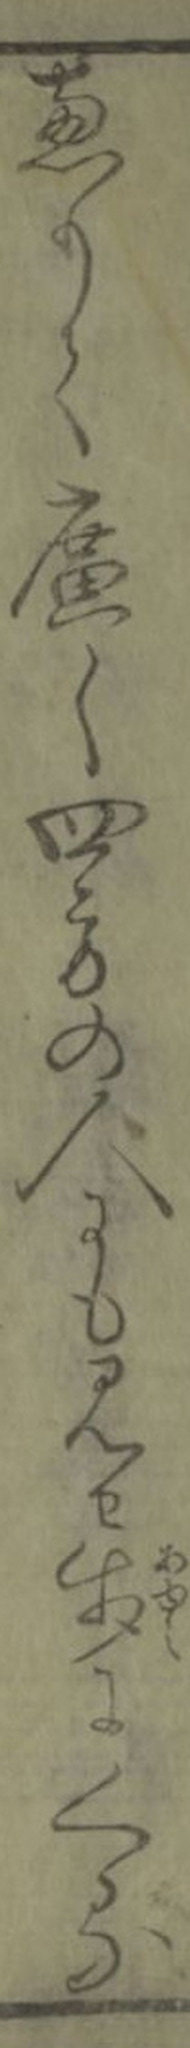ゑりて廣く四方の人にも見せ歩にくる
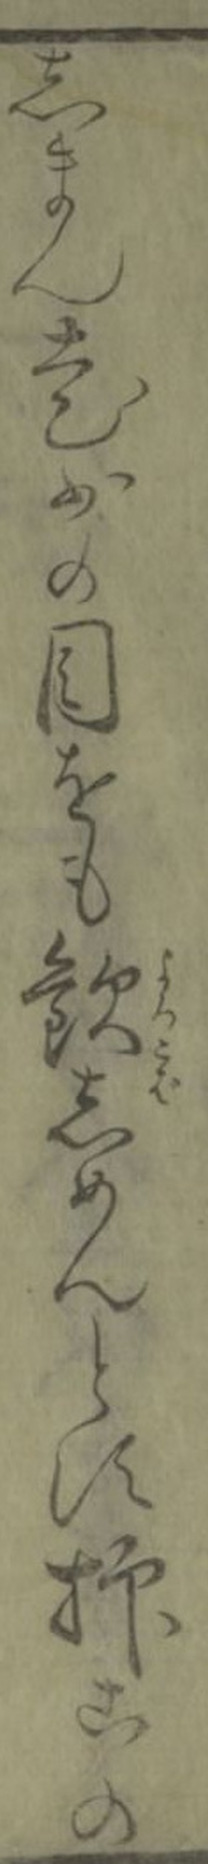しまん老少の目をも歓しめんとす抑この
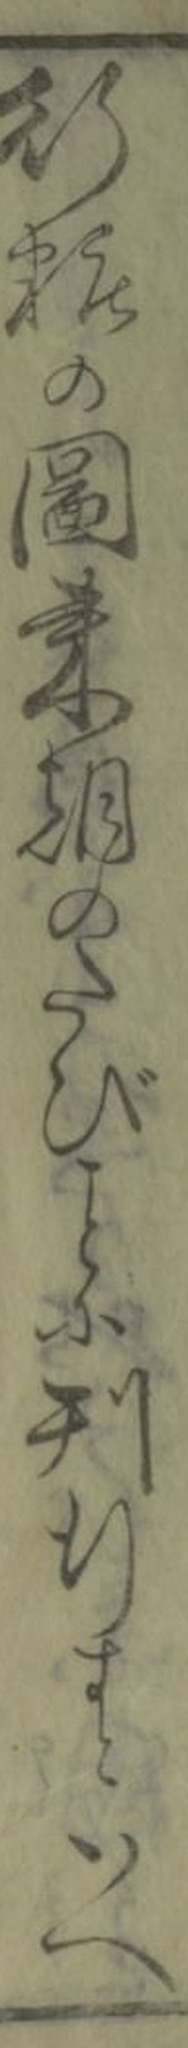行粧の圖来朝のたびことに刊行すといへ
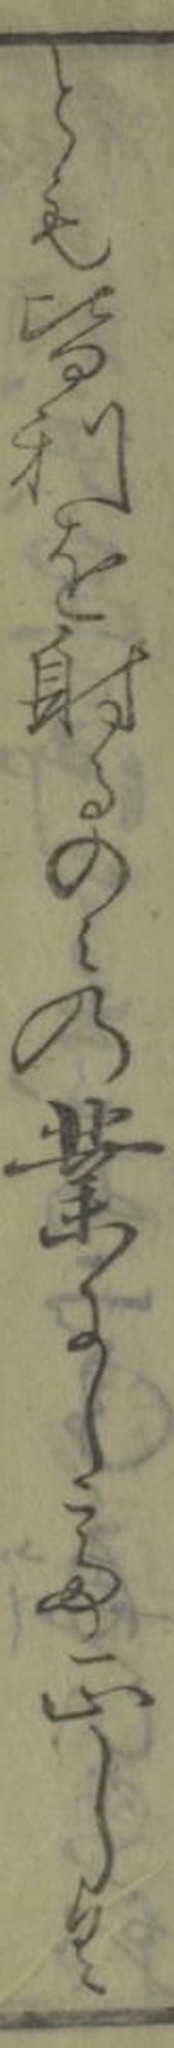とも皆利を射るのみの業にして正しく
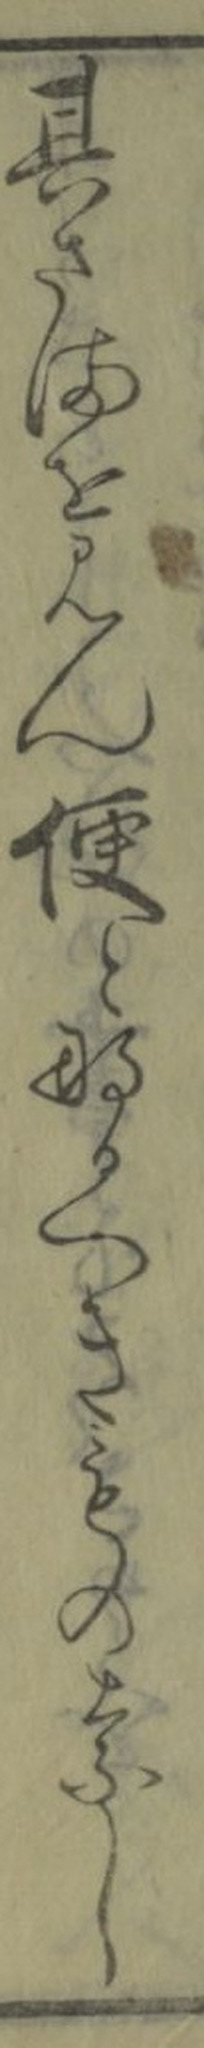其さまを見ん便となるへきものなく
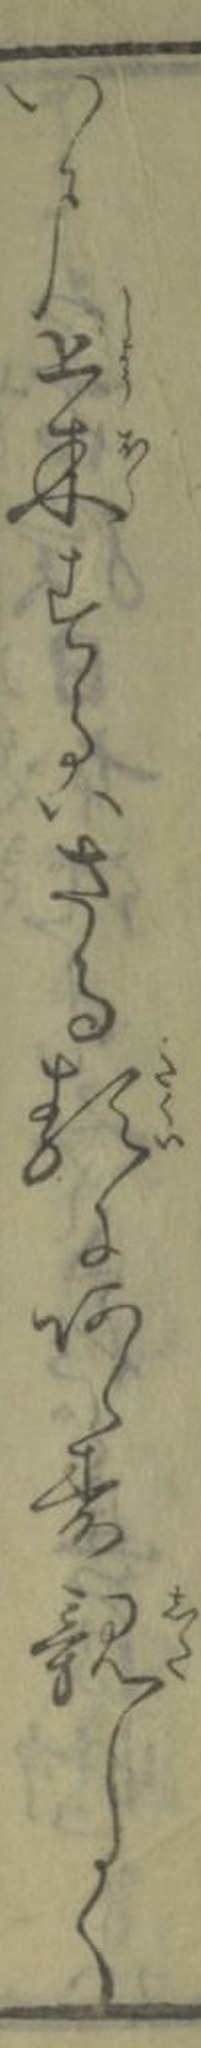いま上木するはさる類にあらす親しく
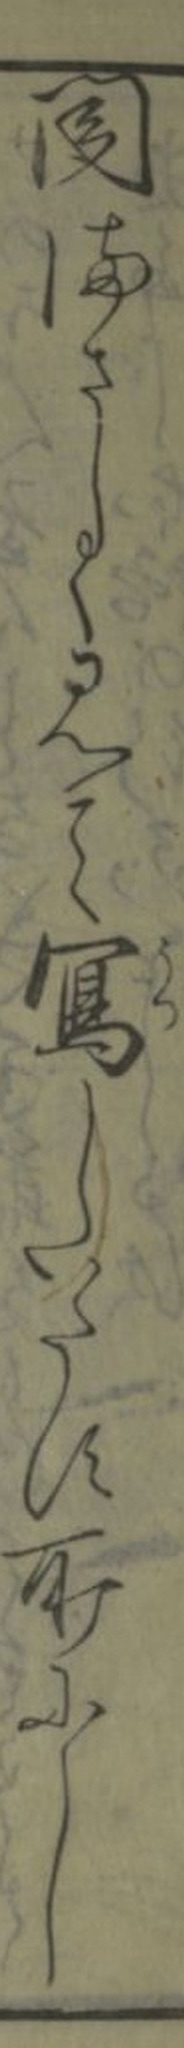聞まさしく見て寫しいたす所にし
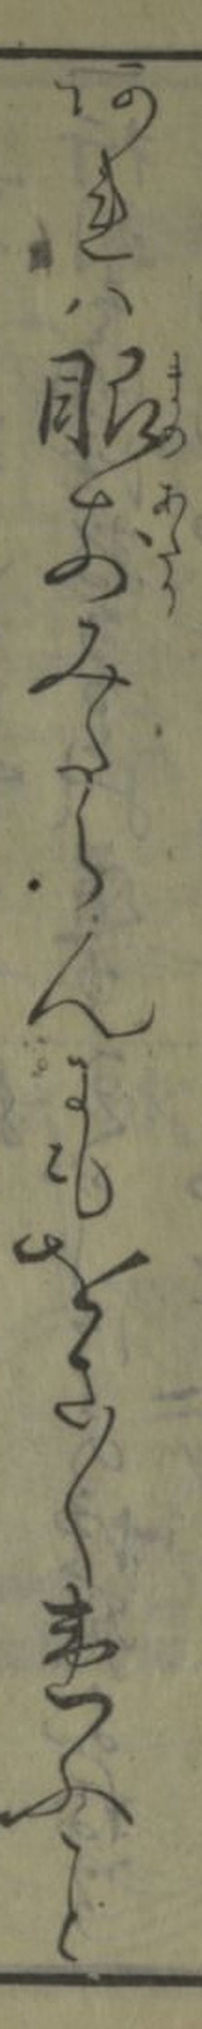あれは眼前みたらんにもをさ〳〵違ふこと
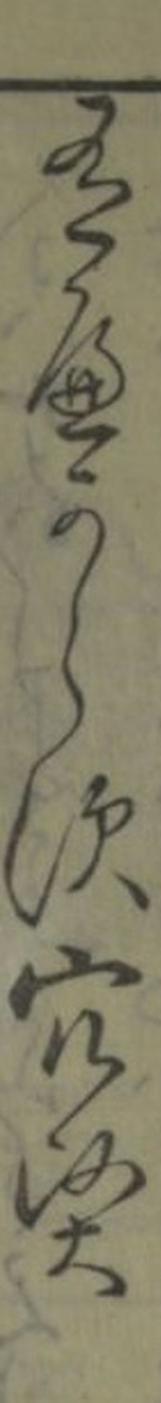有へからす穴賢
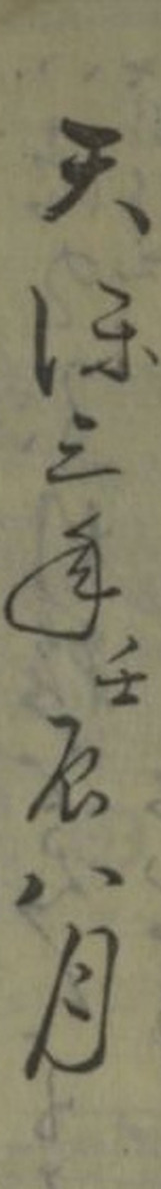天保三年壬辰八月
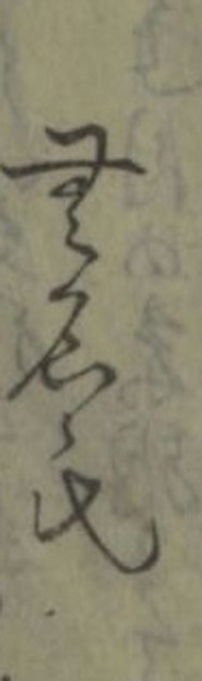無名氏
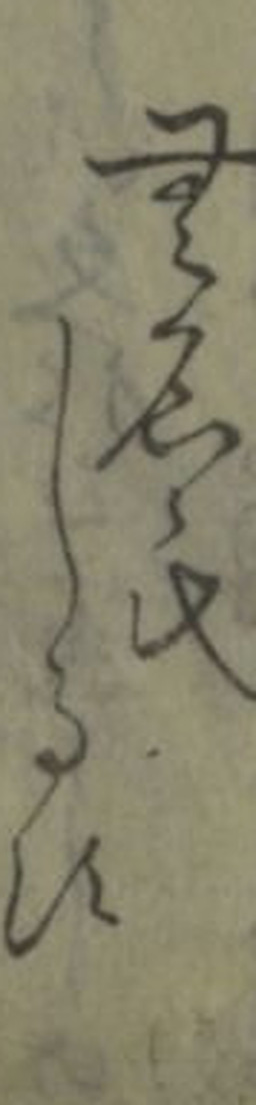しるす

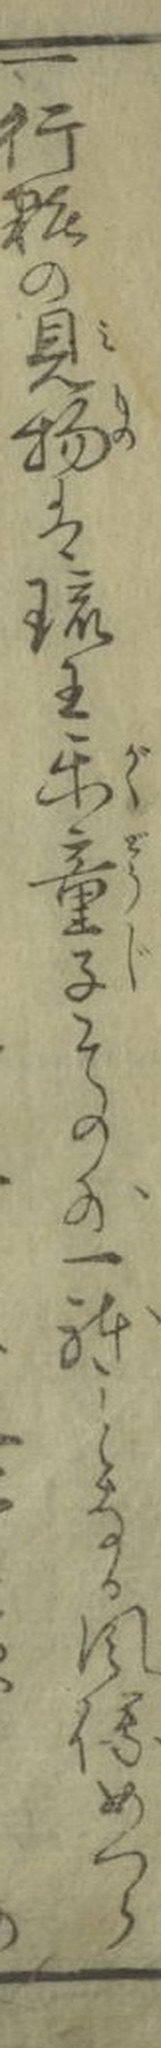一行粧の見物は琉王楽童子その外一躰ことなる風儀めつら
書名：琉球人行列記
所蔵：University of the Ryukyus Library
